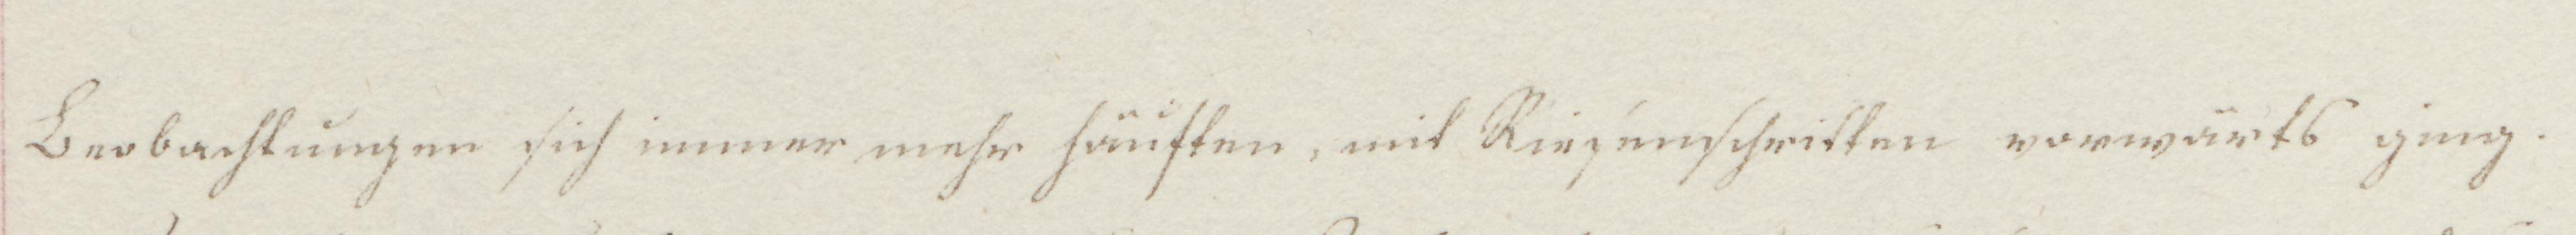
Beobachtungen sich immer mehr häuften, mit Riesenschritten vorwärts ging.
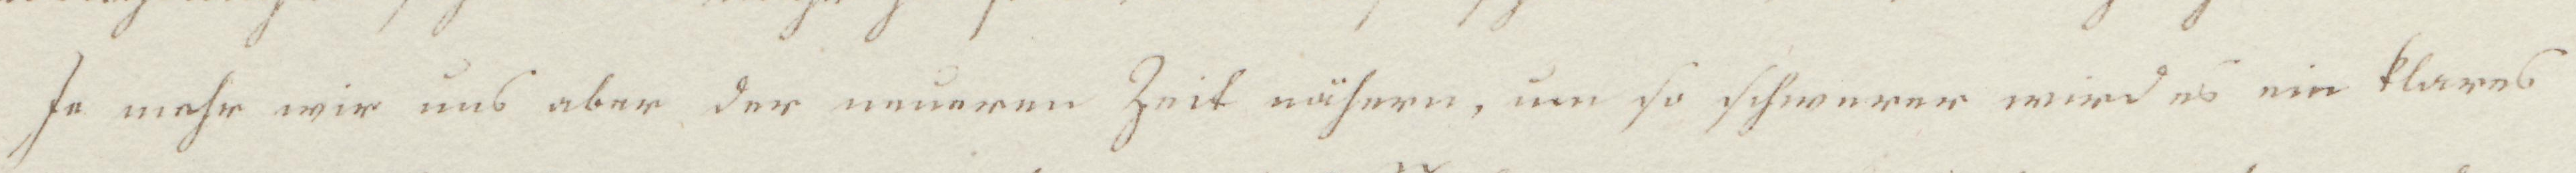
Je mehr wir uns aber der neueren Zeit nähern, um so schwerer wird es ein klares
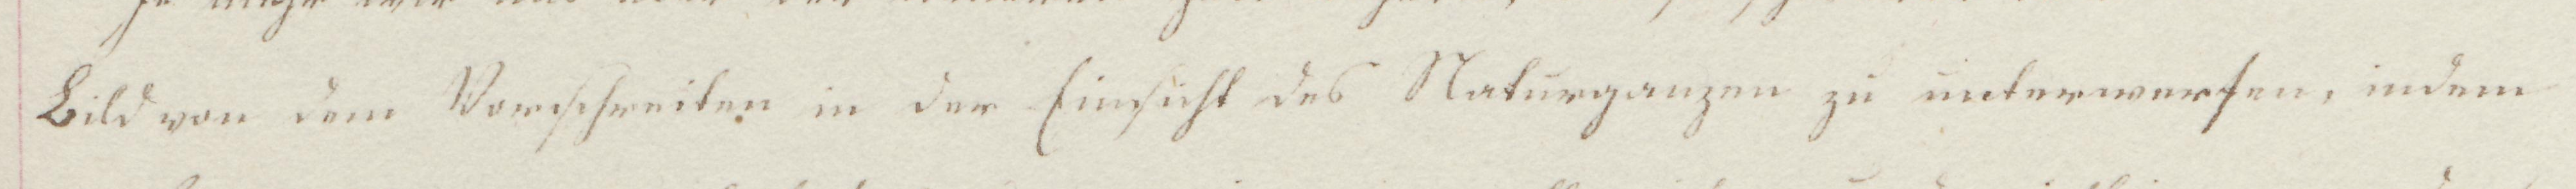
Bild von dem Vorschreiten in der Einsicht des Naturganzen zu unterwerfen, indem
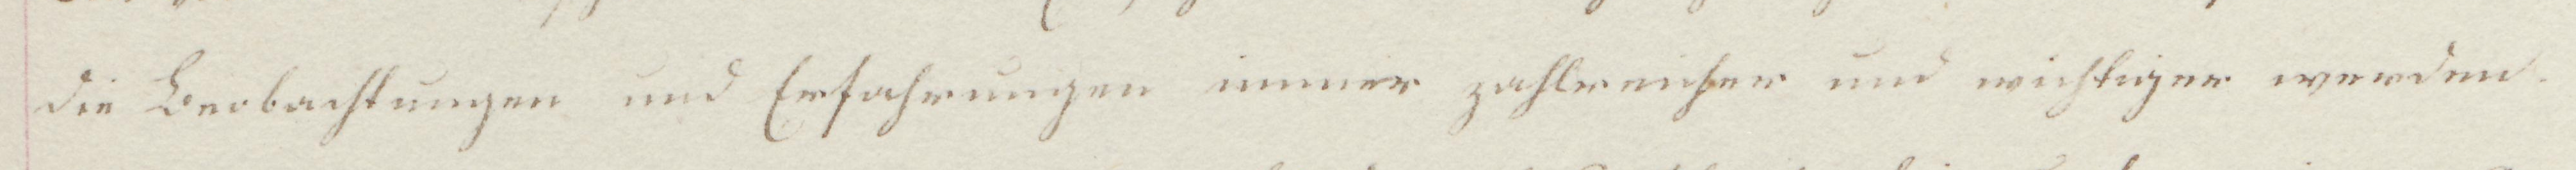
die Beobachtungen und Erfahrungen immer zahlreicher und wichtiger werden.
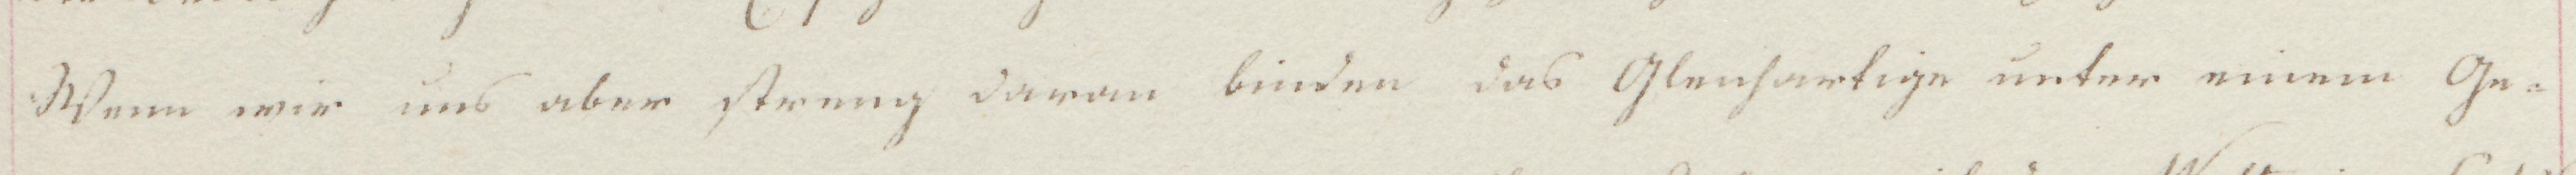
Wenn wir uns aber streng daran binden das Gleichartige unter einem Ge-
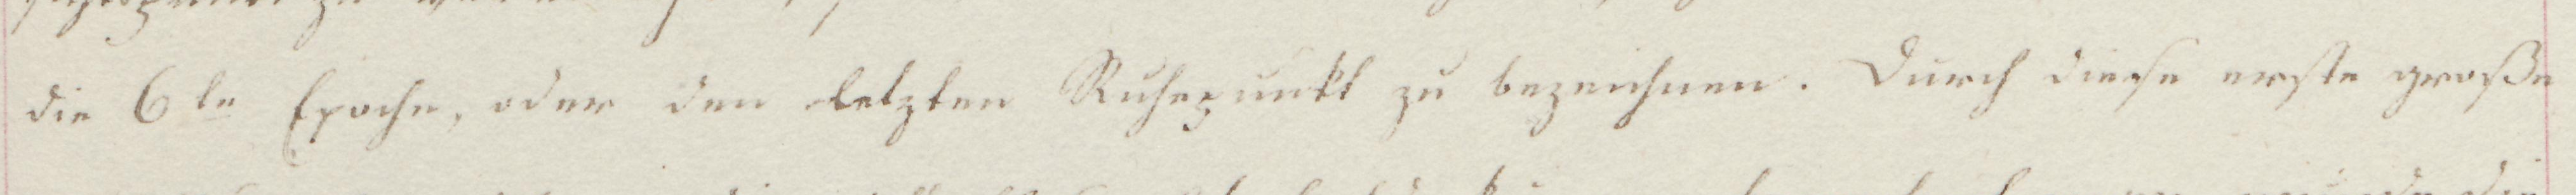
die 6te Epoche, oder den letzten Ruhepunkt zu bezeichnen. Durch diese erste große
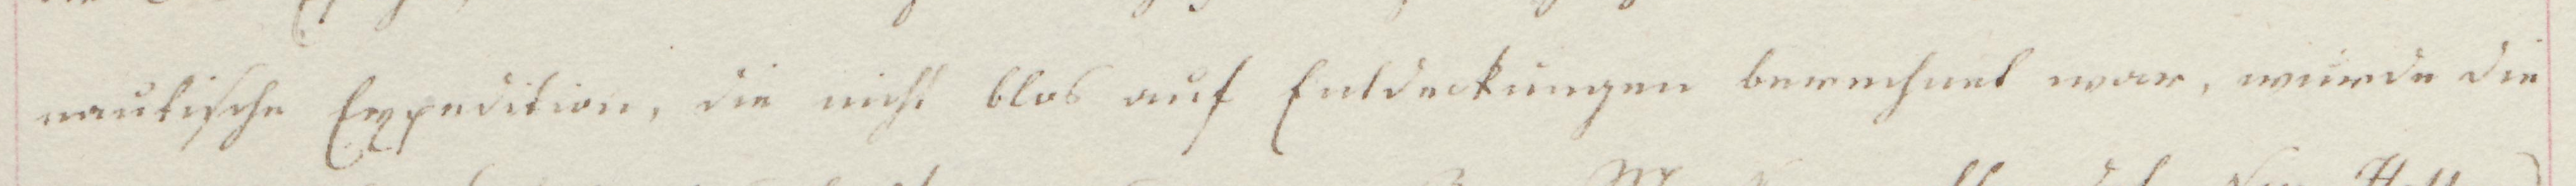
nautische Expedition, die nicht blos auf Entdeckungen berechnet war, wurde die
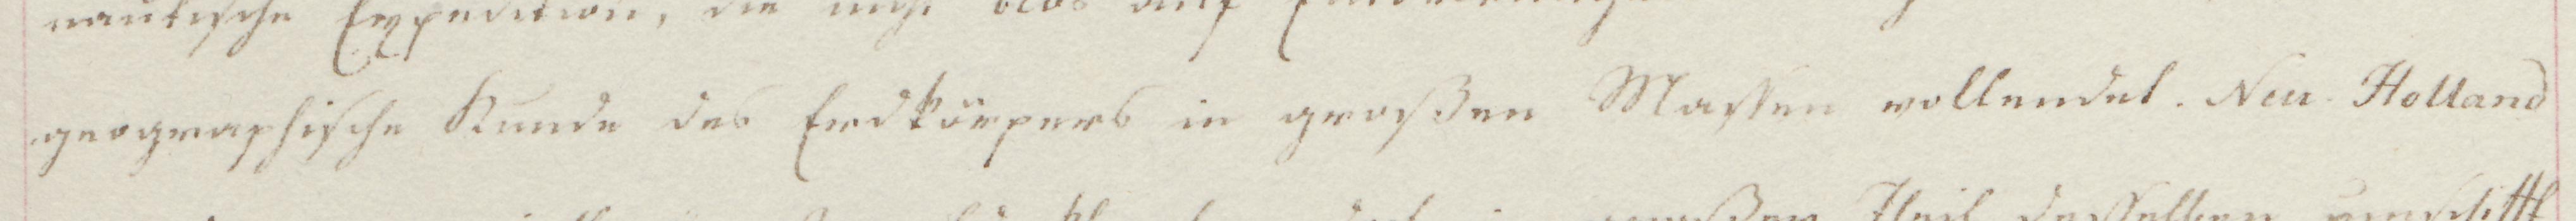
geographische Kunde des Erdkörpers in großen Massen vollendet. Neu Holland
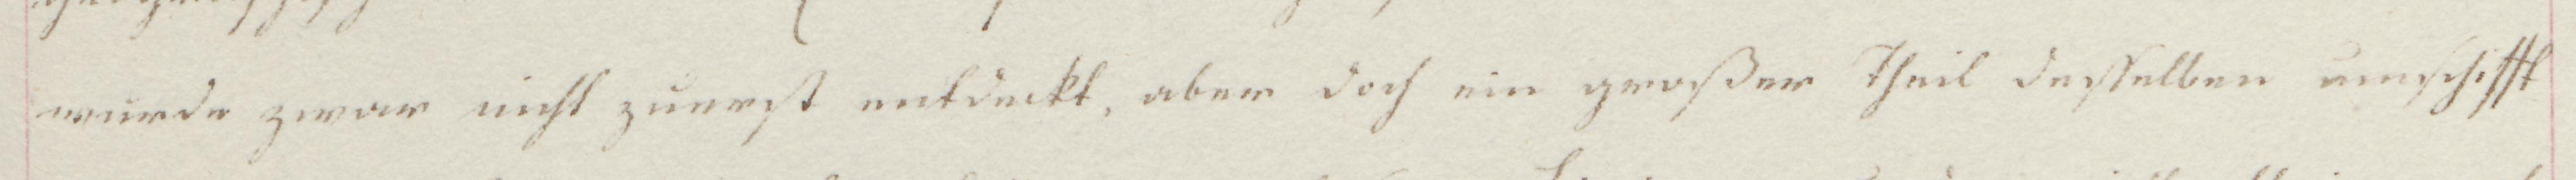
wurde zwar nicht zuerst entdeckt, aber doch ein großer Theil desselben umschifft
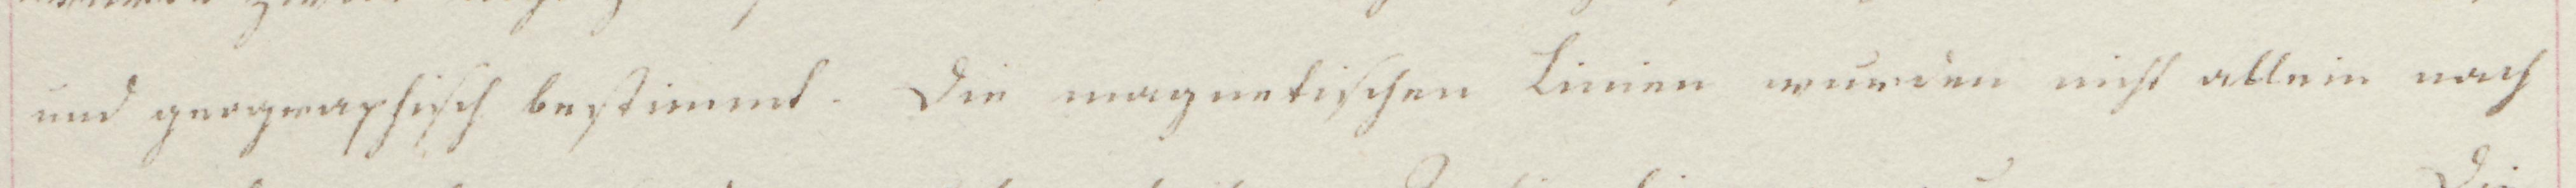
und geographisch bestimmt. Die magnetischen Linien wurden nicht allein nach
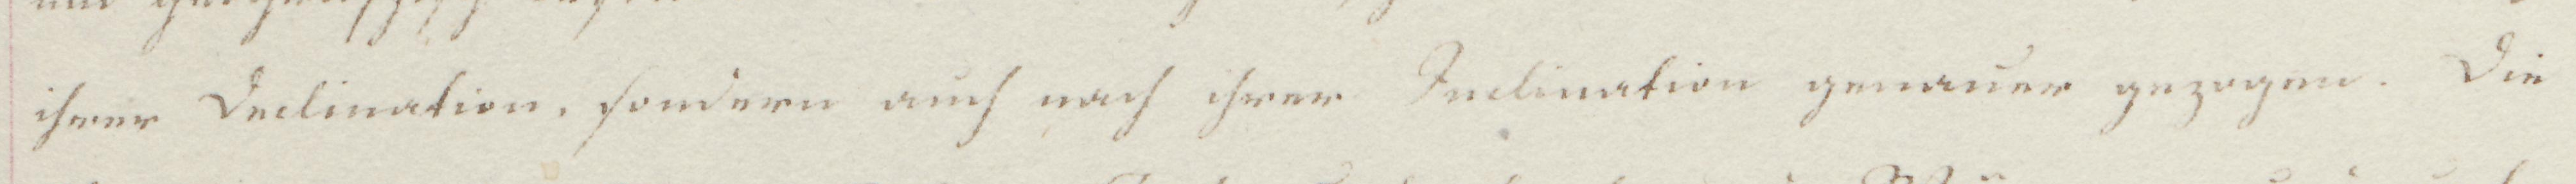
ihrer Declination, sondern auch nach ihrer Inclination genauer gezogen. Die
